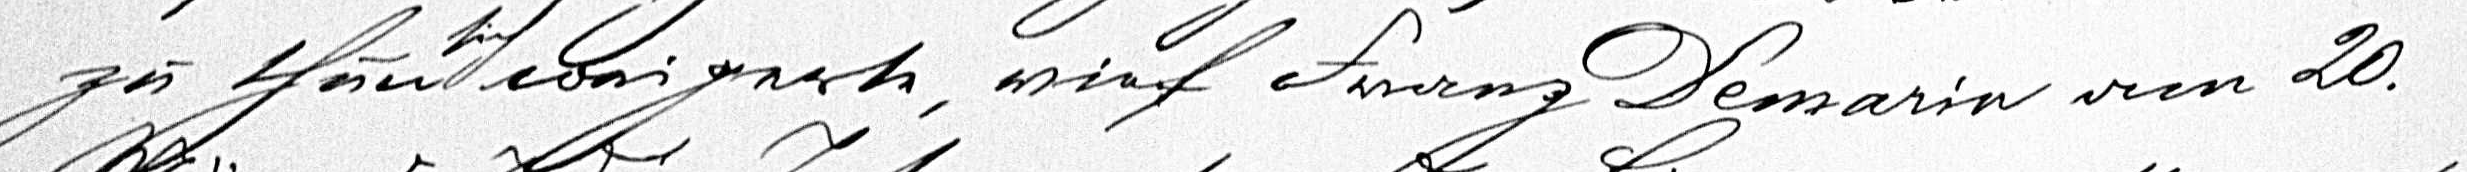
zu thun weigerte, rief Franz Demarin am 20.
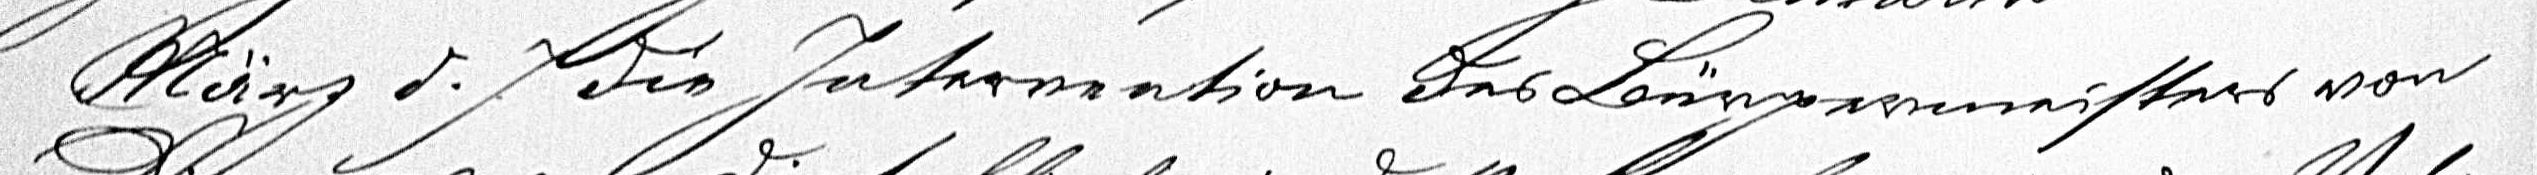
März d. J. die Intervention des Bürgermeisters von
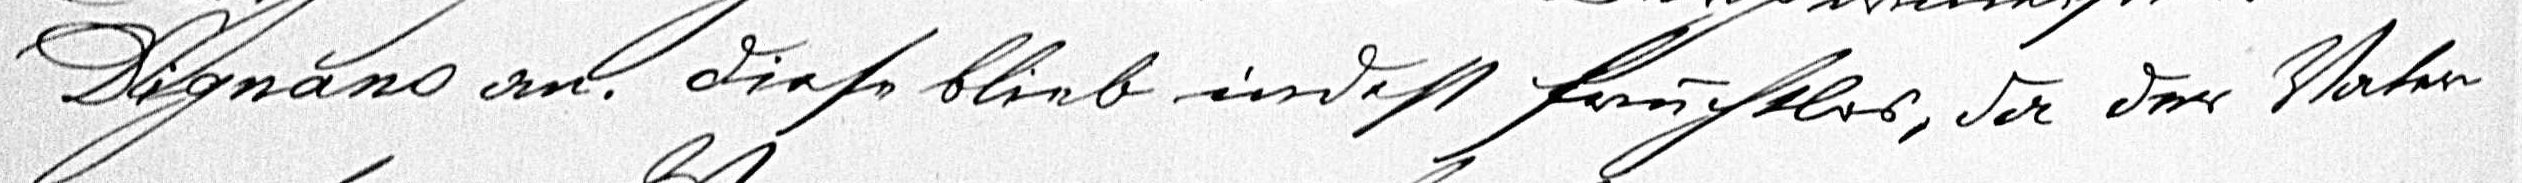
Dignano an. Diese blieb indeß fruchtlos, da der Vater
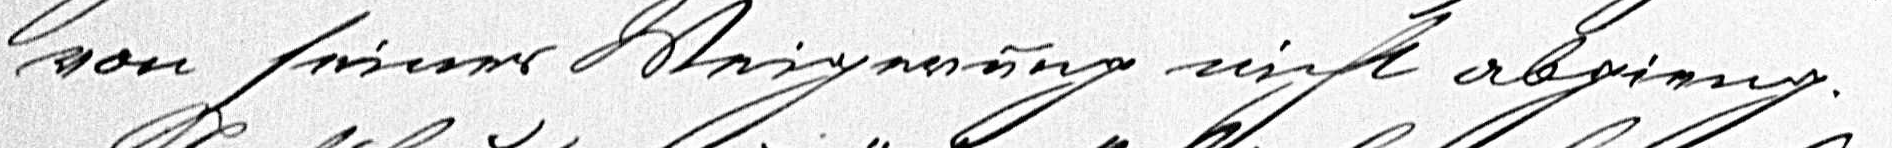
von seiner Weigerung nicht abgieng.
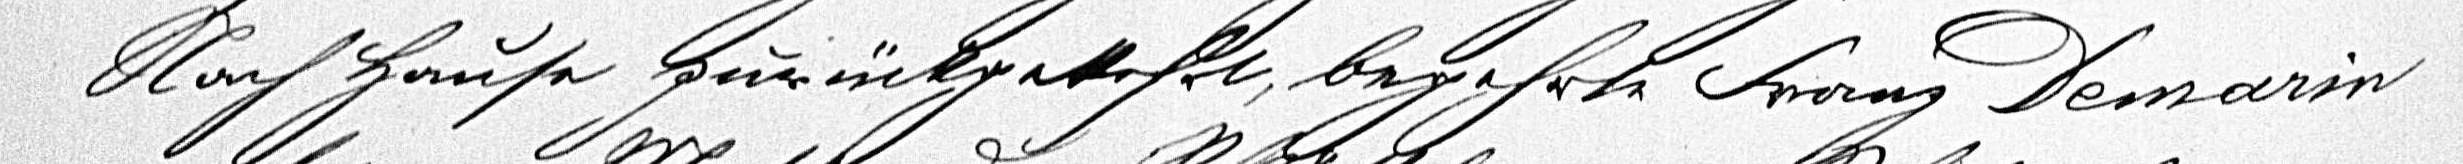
Nach Hause zurückgekehrt, begehrte Franz Demarin
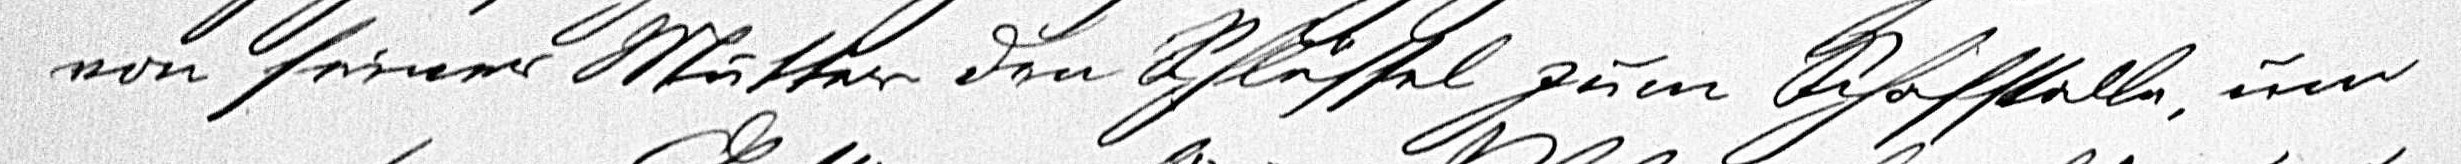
von seiner Mutter den Schlüssel zum Schafstalle, um
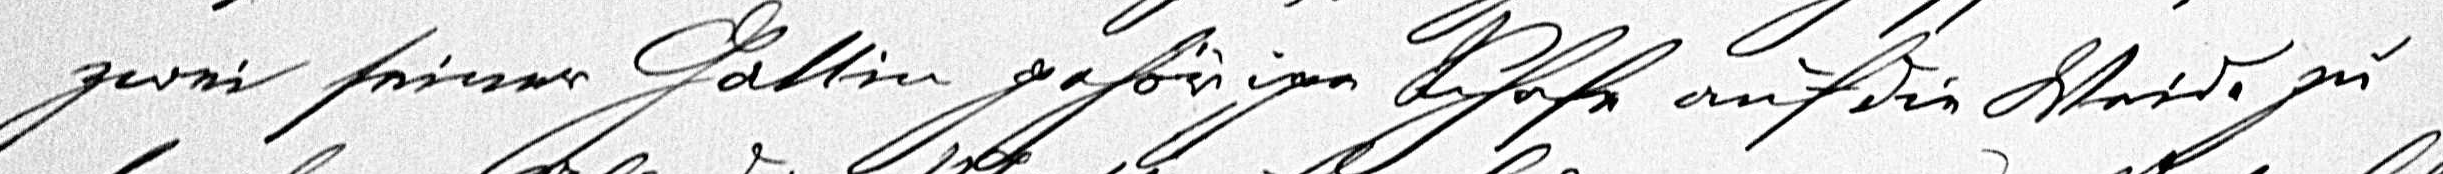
zwei seiner Gattin gehörigen Schafe auf die Weide zu
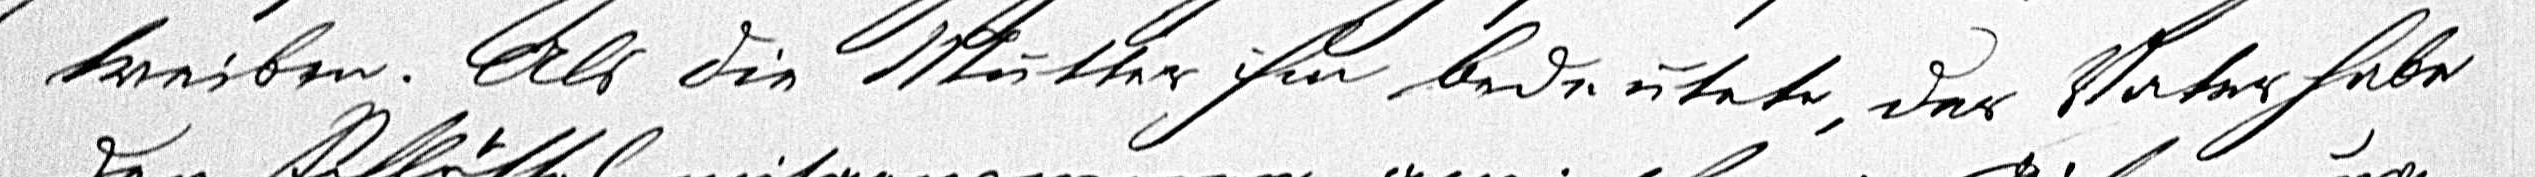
treiben. Als die Mutter ihm bedeutete, der Vater habe
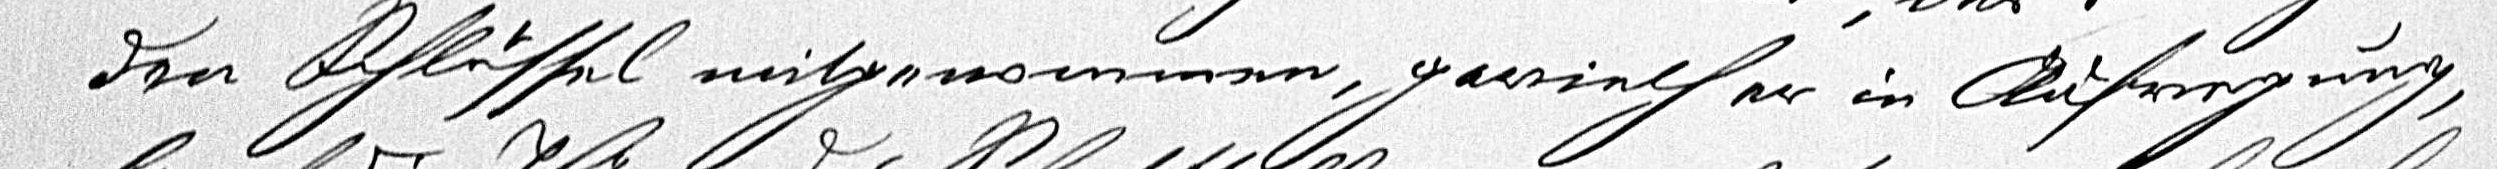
den Schlüssel mitgenommen, gerieth er in Ausregung,
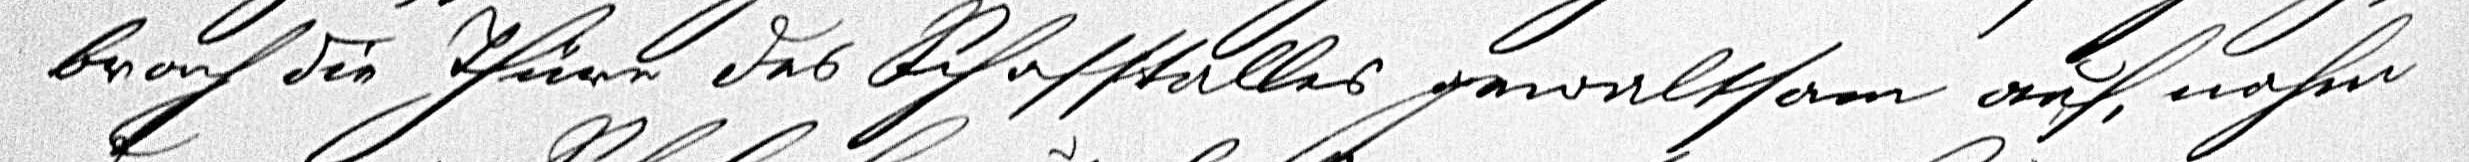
brach die Thüre des Schafstalles gewaltsam auf, nahm
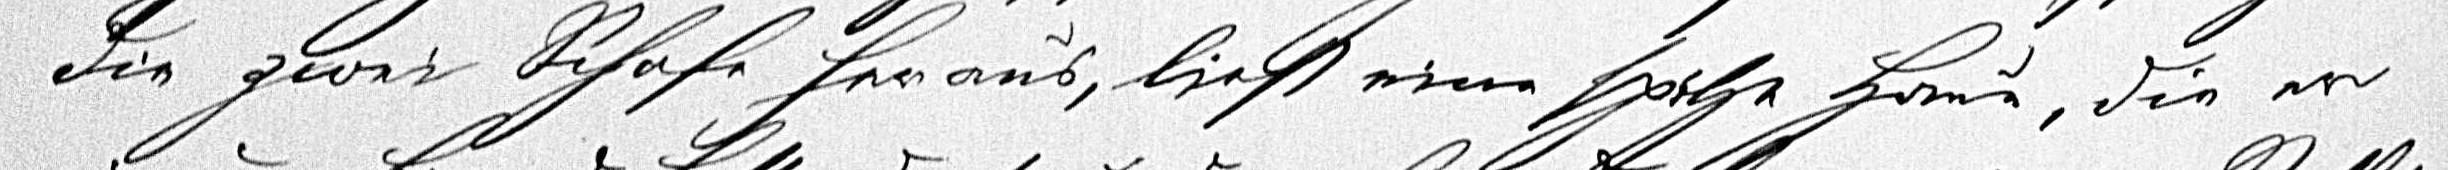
die zwei Schafe heraus, ließ eine spitze Haue, die er
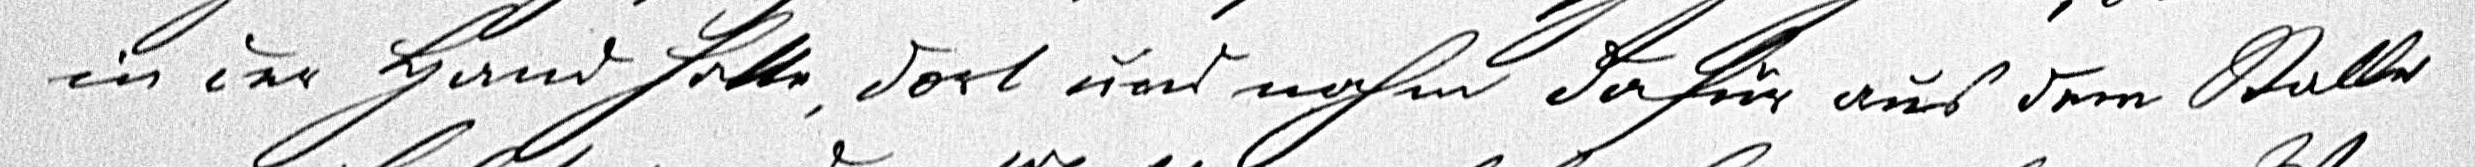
in der Hand hatte, dort und nahm dafür aus dem Stalle
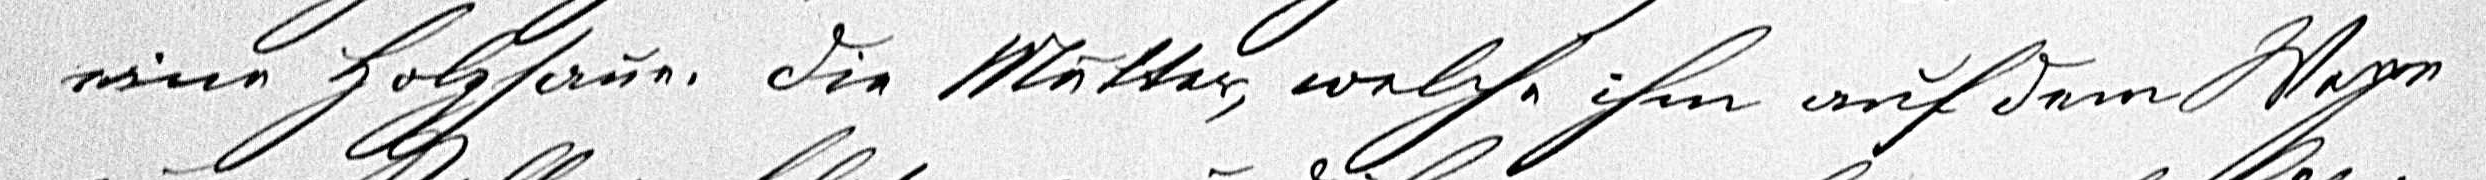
eine Holzhaue. Die Mutter, welche ihm auf dem Wege
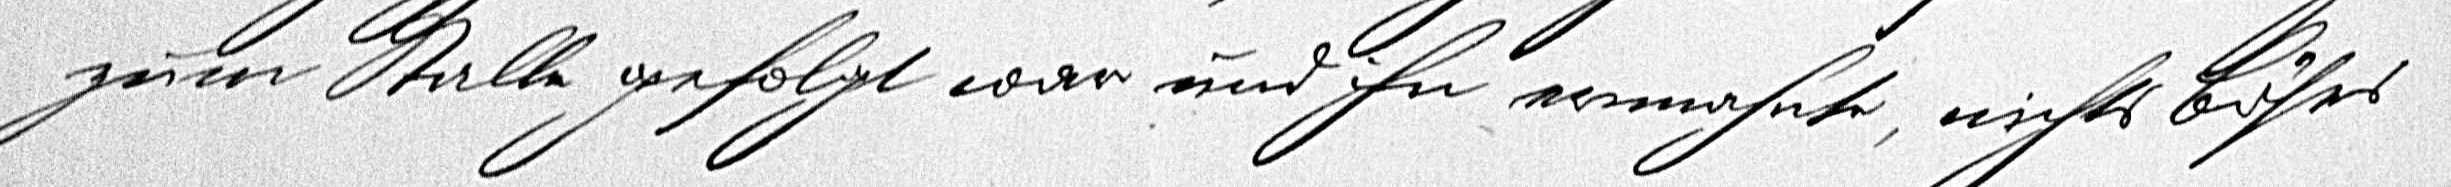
zum Stalle gefolgt war und ihn ermahnte, nichts böses
